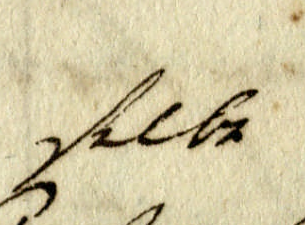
selbe
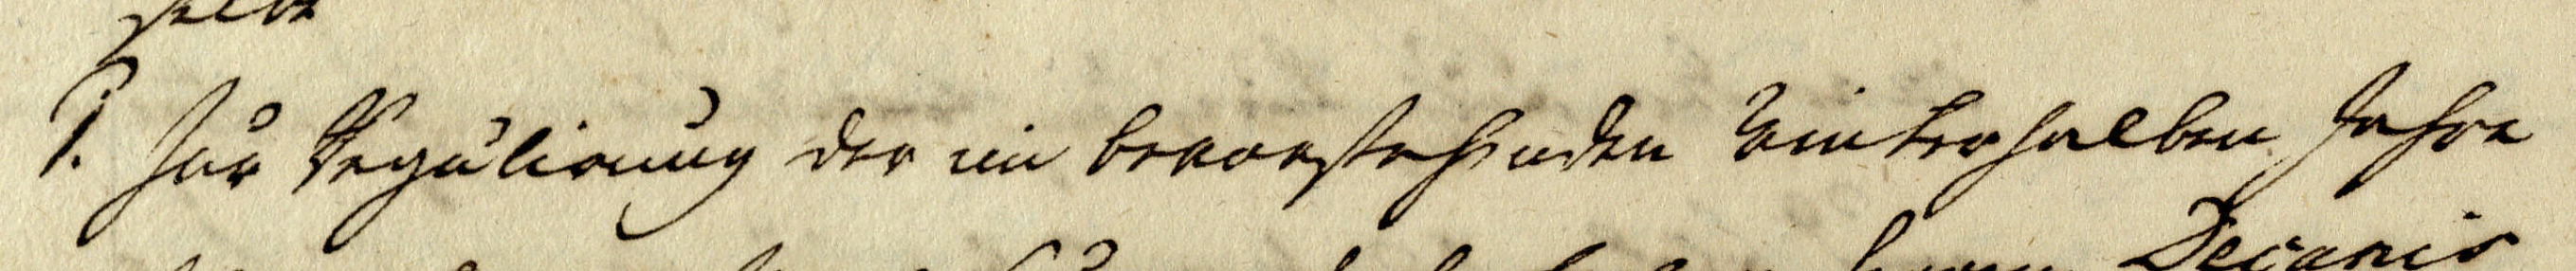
1. Zur Regulirung der im bevorstehenden Winterhalben Jahre
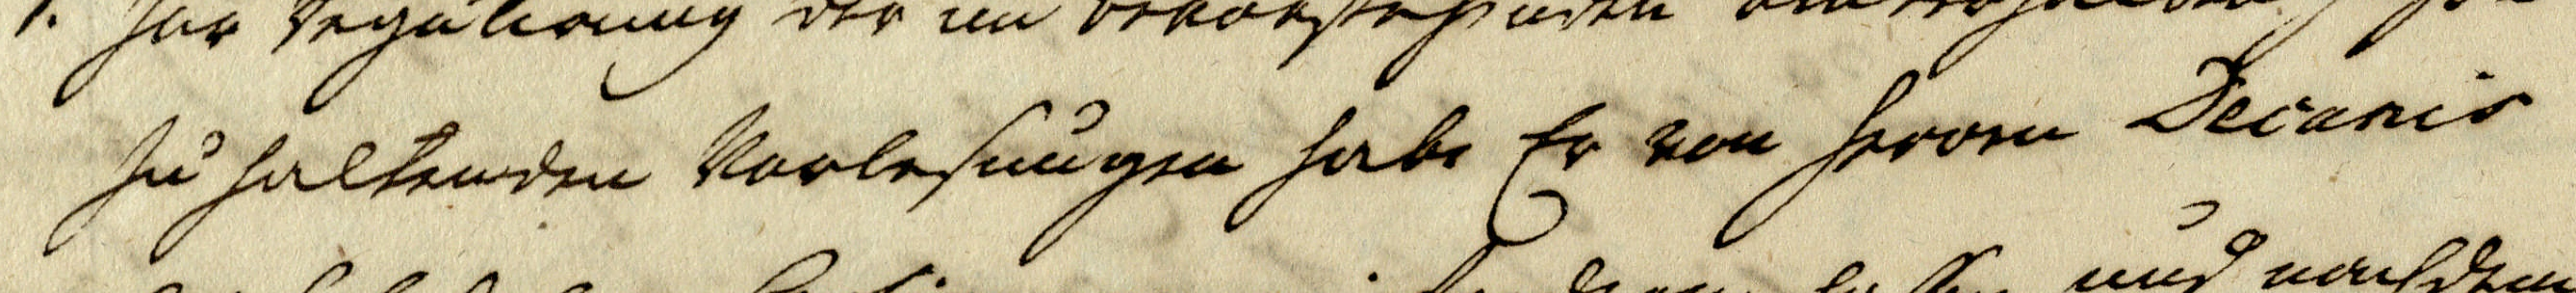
zu haltenden Vorlesungen habe Er von Herren Decanis
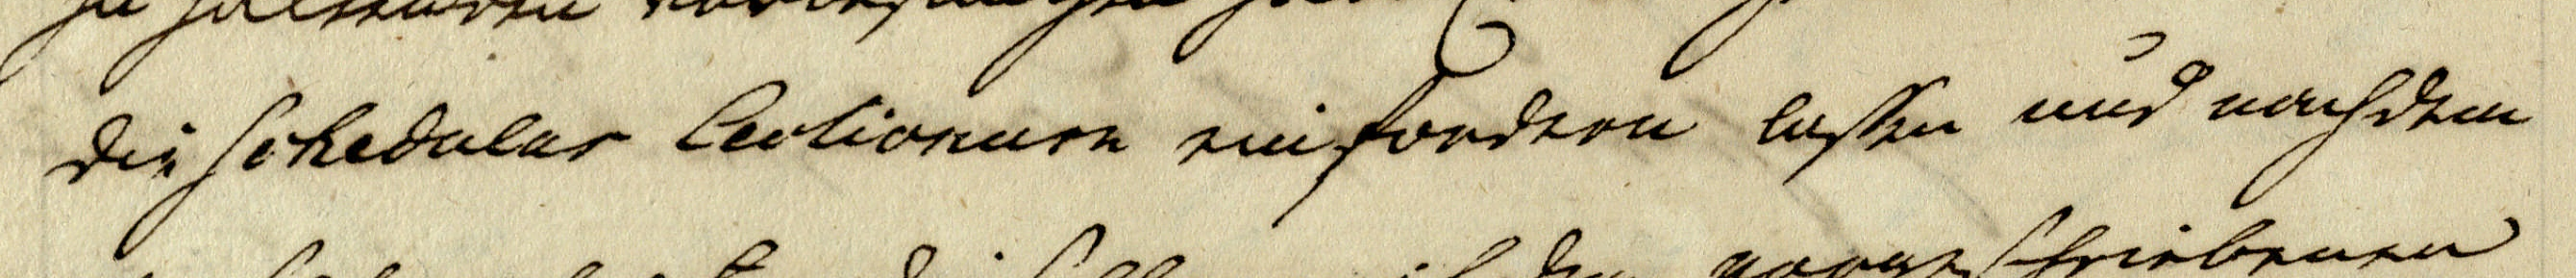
die schedulas Lectionum einfordern lassen und nachdem
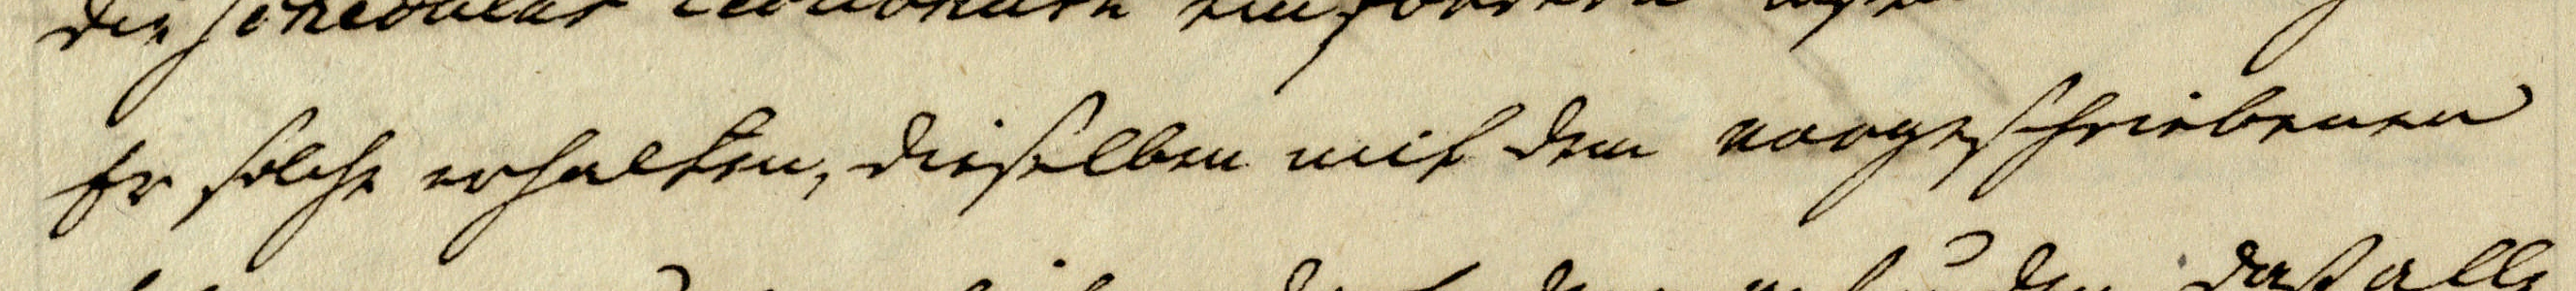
Er solche erhalten, dieselben mit dem vorgeschriebenen
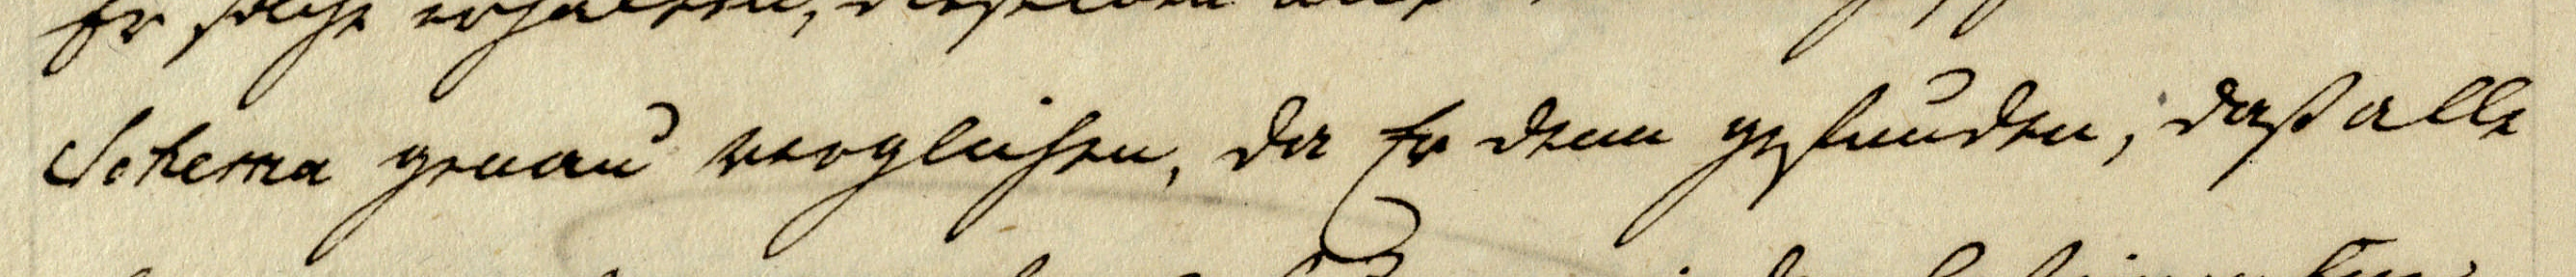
Schema genau verglichen, da Er denn gefunden; daß alle
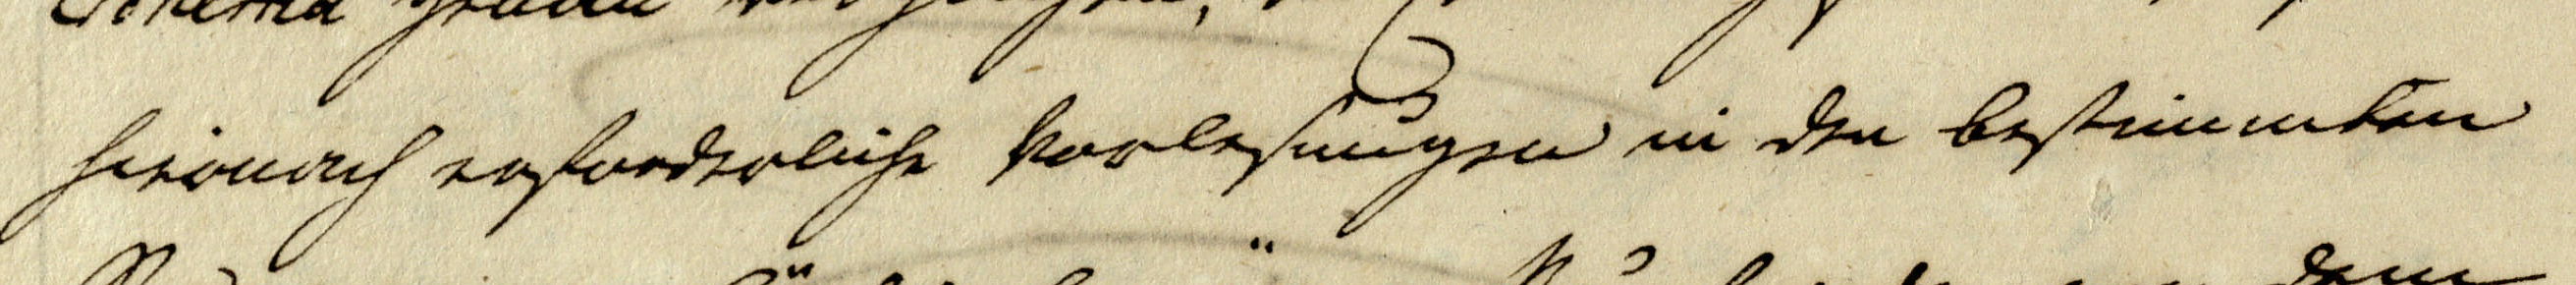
hiernach erforderliche Vorlesungen in den bestimmten
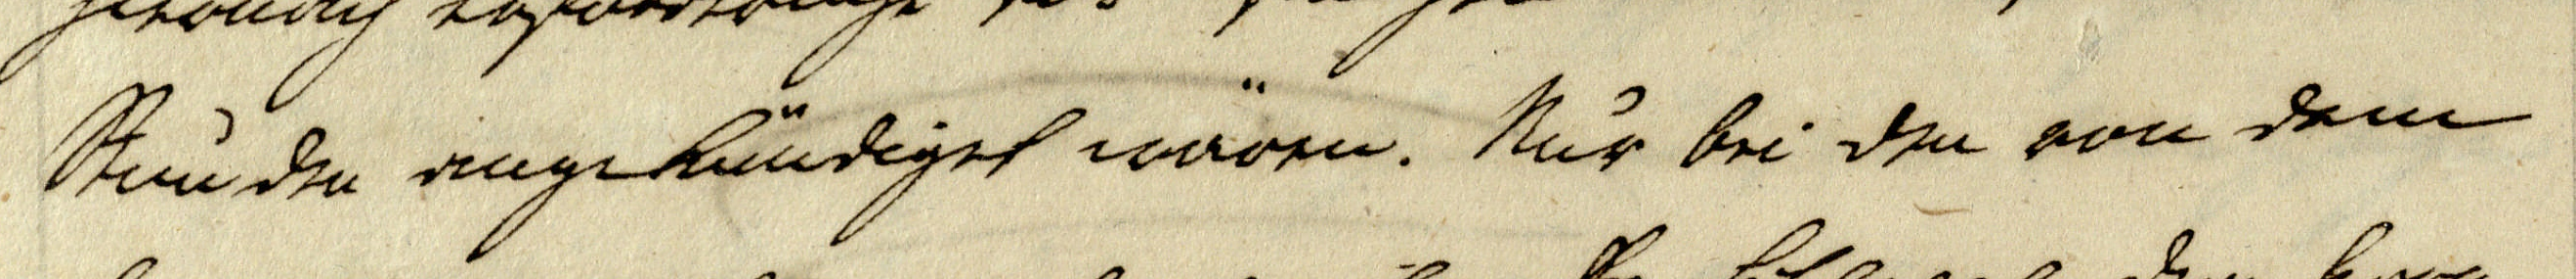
Stunden angekündiget wären. Nur bei den von dem
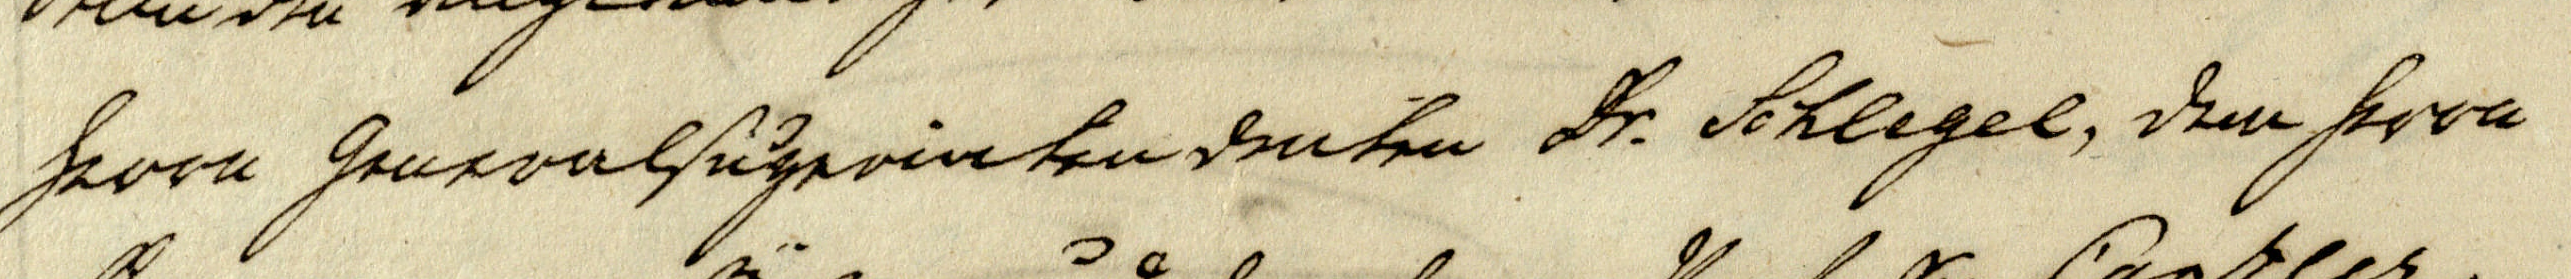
Herrn Generalsuperintendenten Dr. Schlegel, dem Herrn
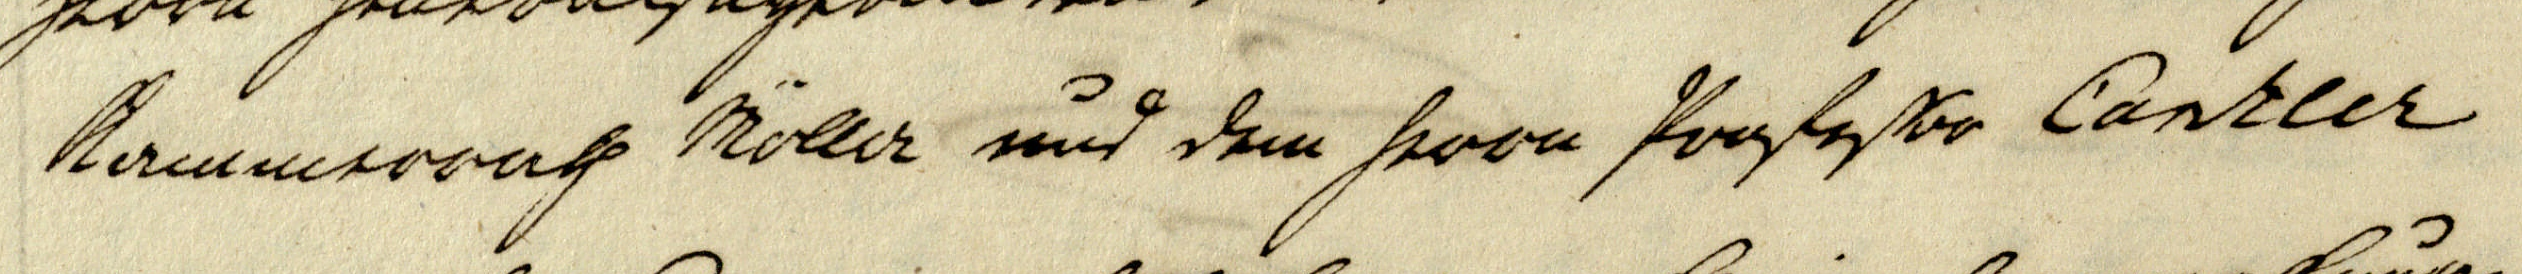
Kammerrath Möller und dem Herrn Professor Canzler
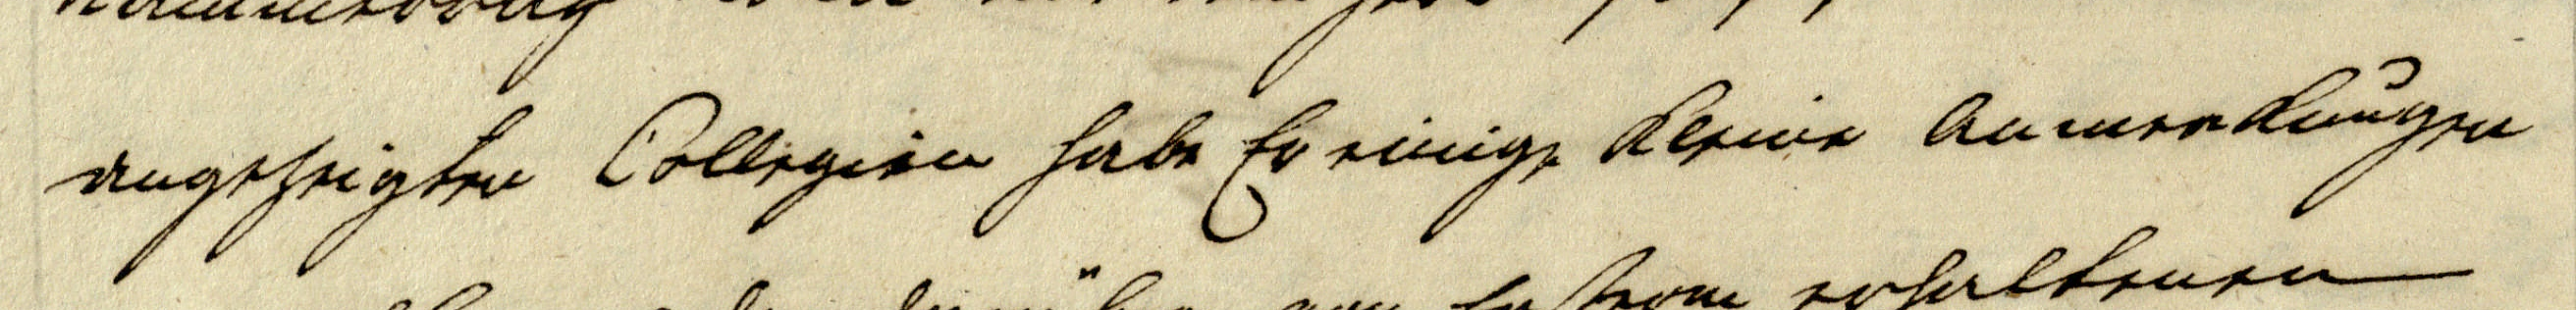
angezeigten Collegien habe Er einige kleine Anmerkungen
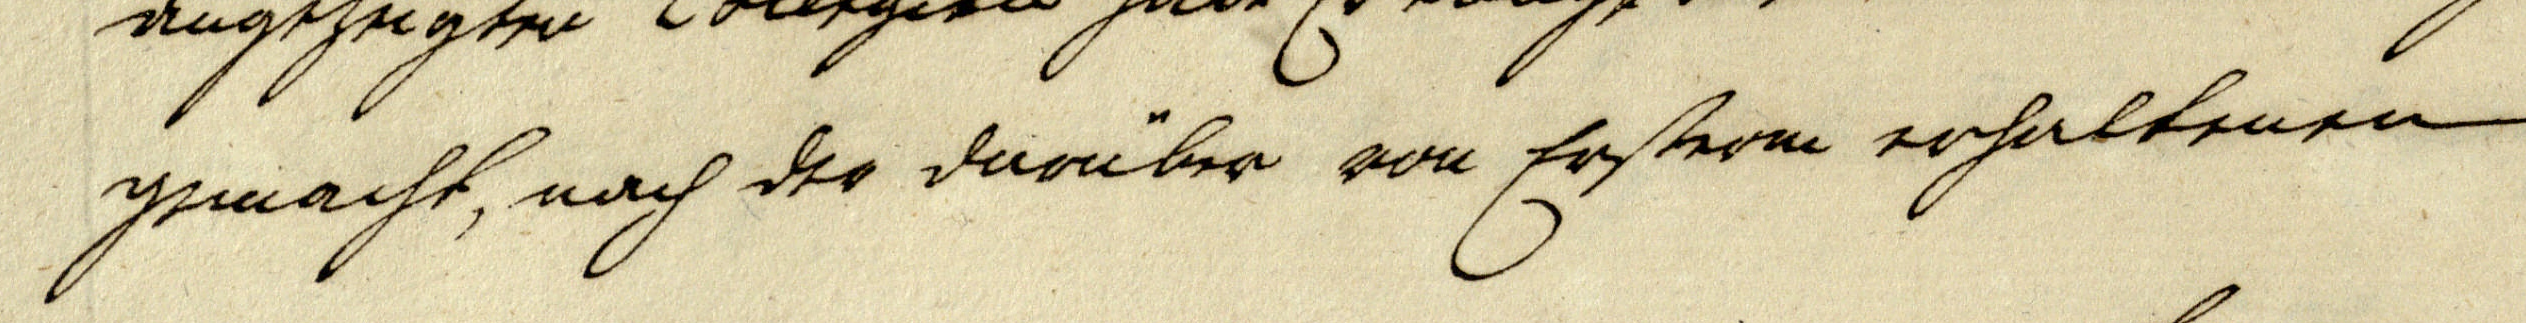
gemacht, nach der darüber von Ersterm erhaltenen
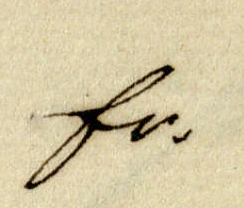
Er¬
